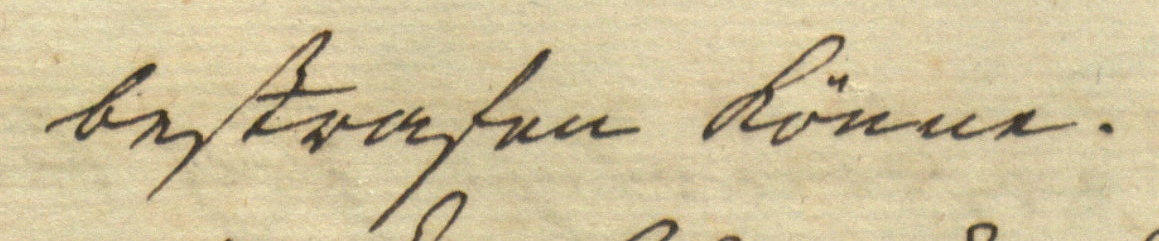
bestrafen könne.
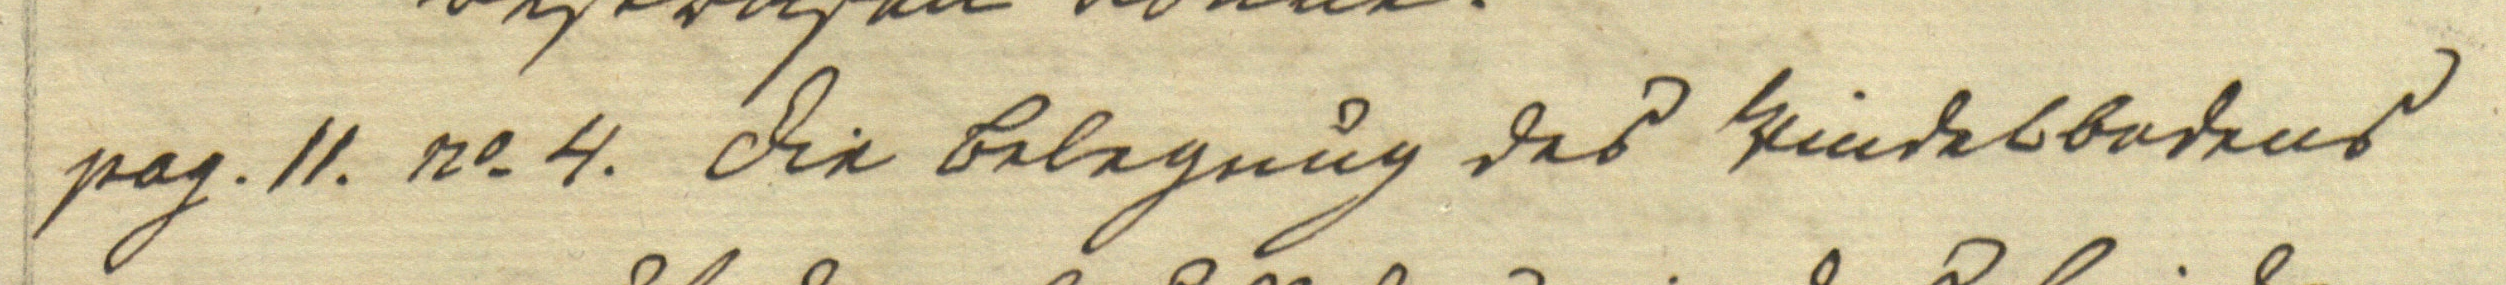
pag. 11. No 4. Die Belegung des Windelbodens
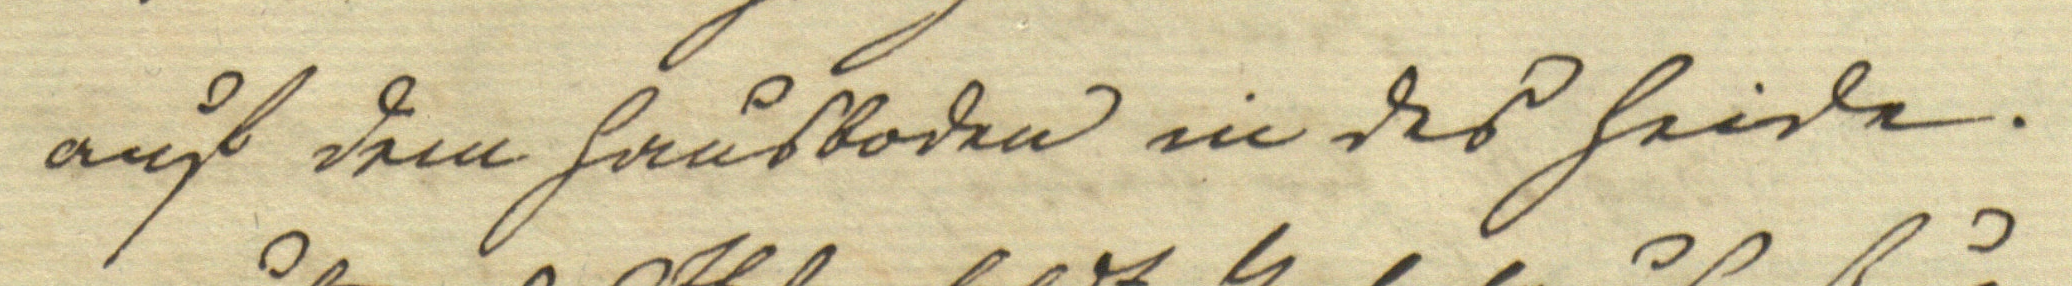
auf dem Hausboden in des Heide-
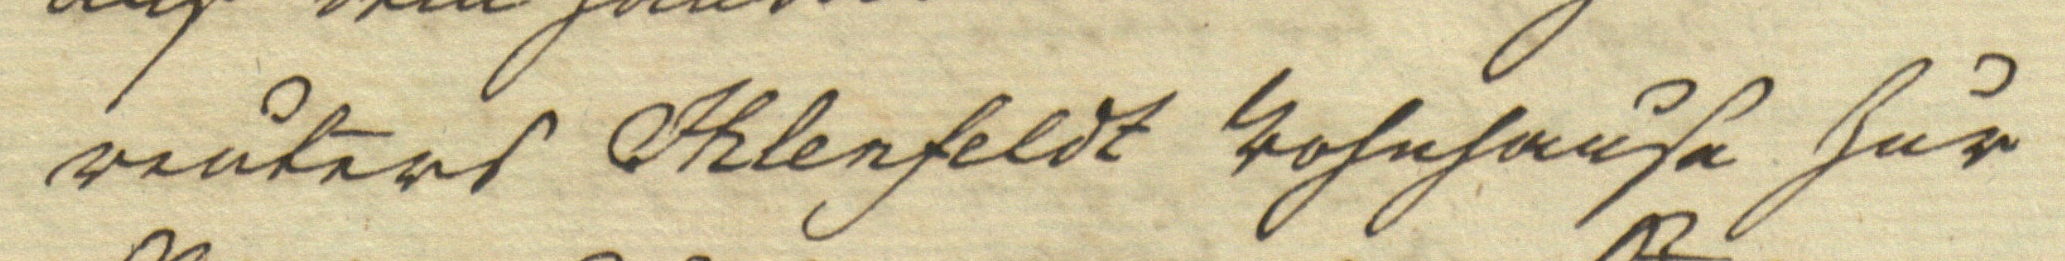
reuters Ihlenfeldt Wohnhause zur
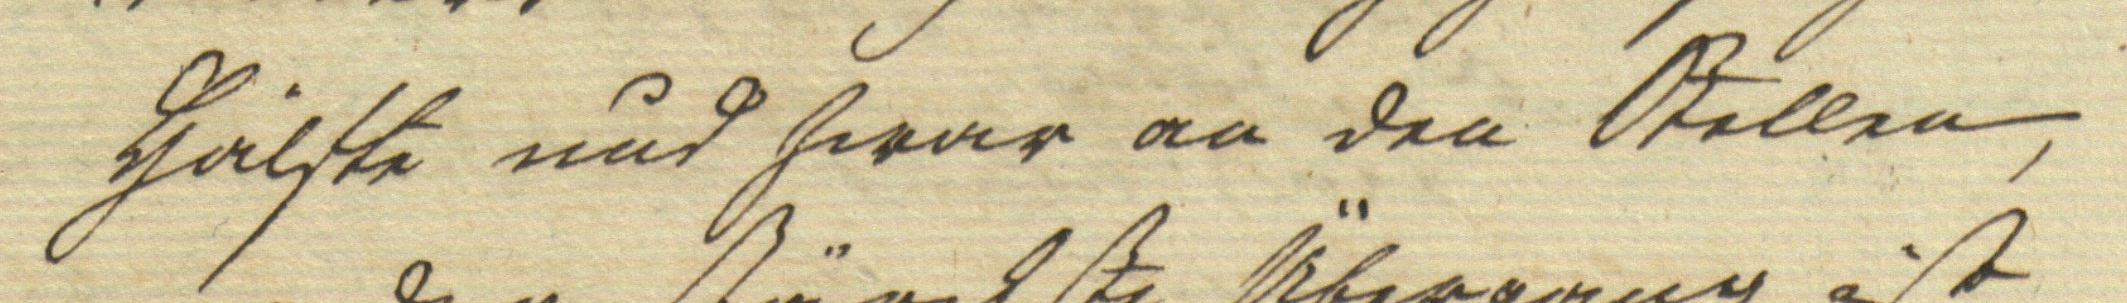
Hälfte und zwar an den Stellen,
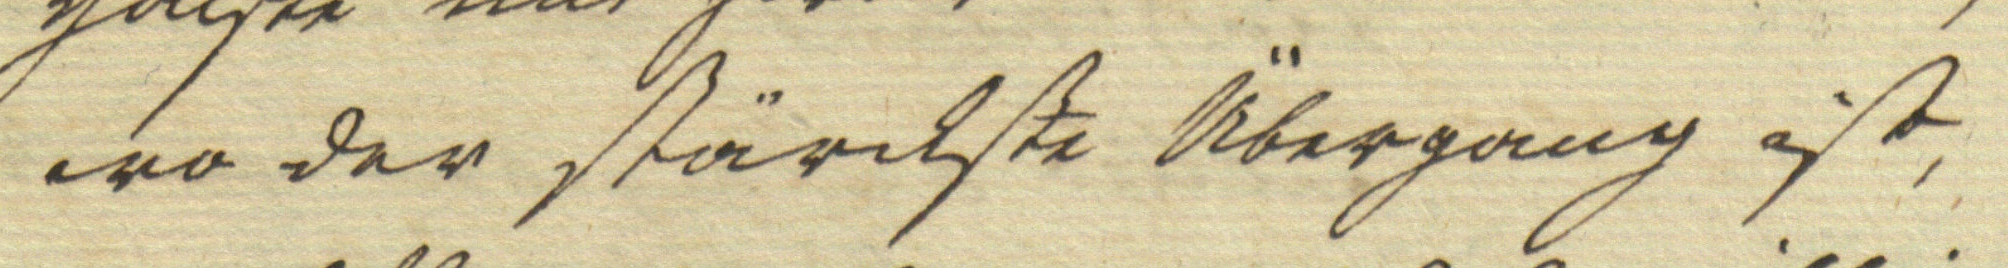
wo der stärckste Übergang ist,
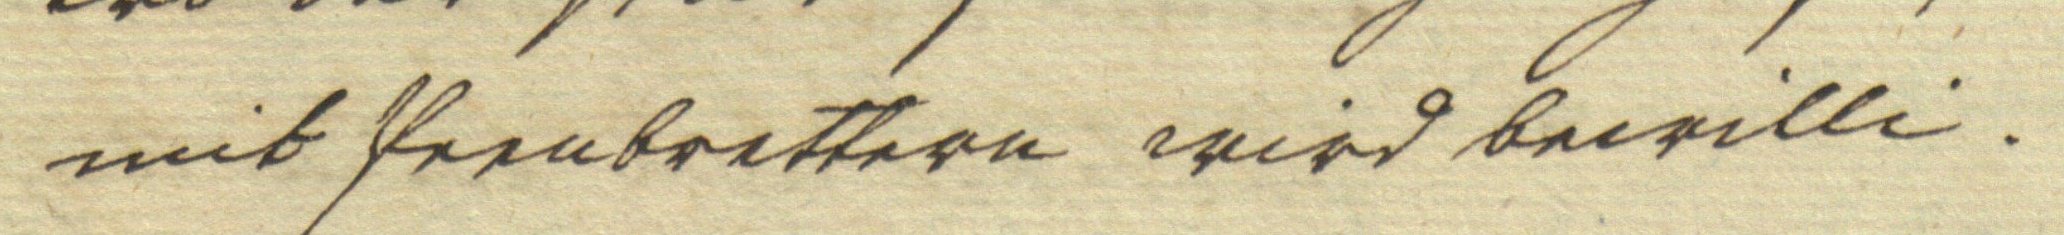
mit Peenbrettern wird bewilli¬
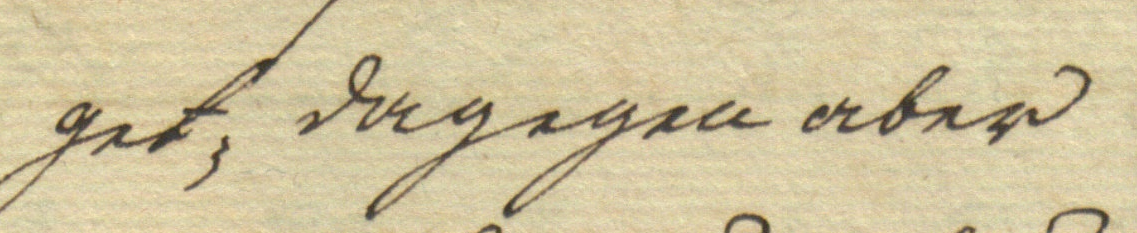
get, dagegen aber
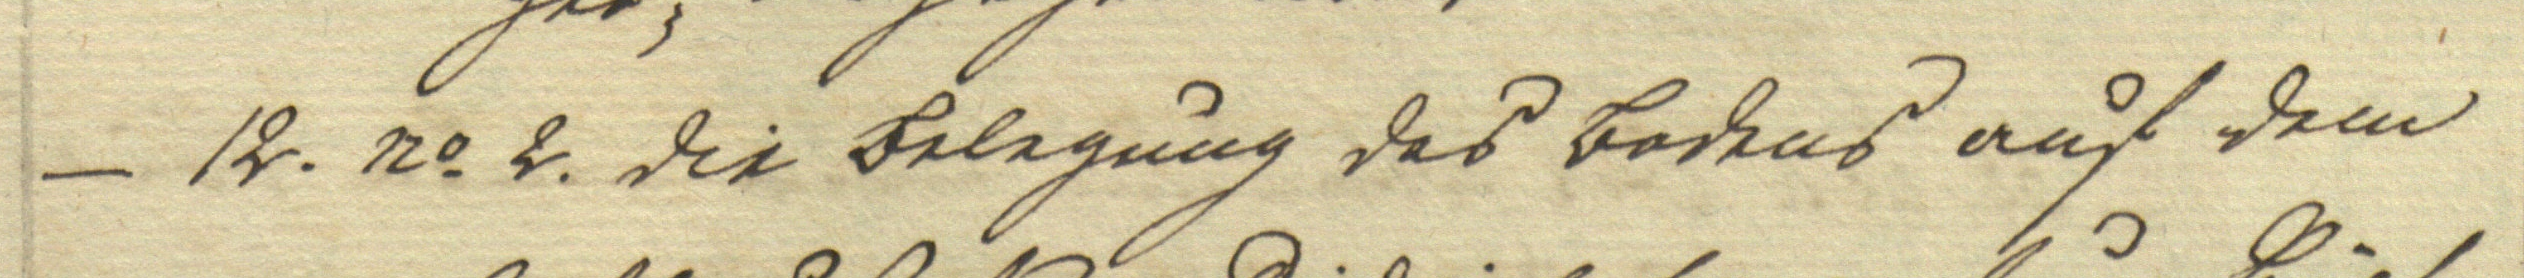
12. No 2. die Belegung des Bodens auf dem
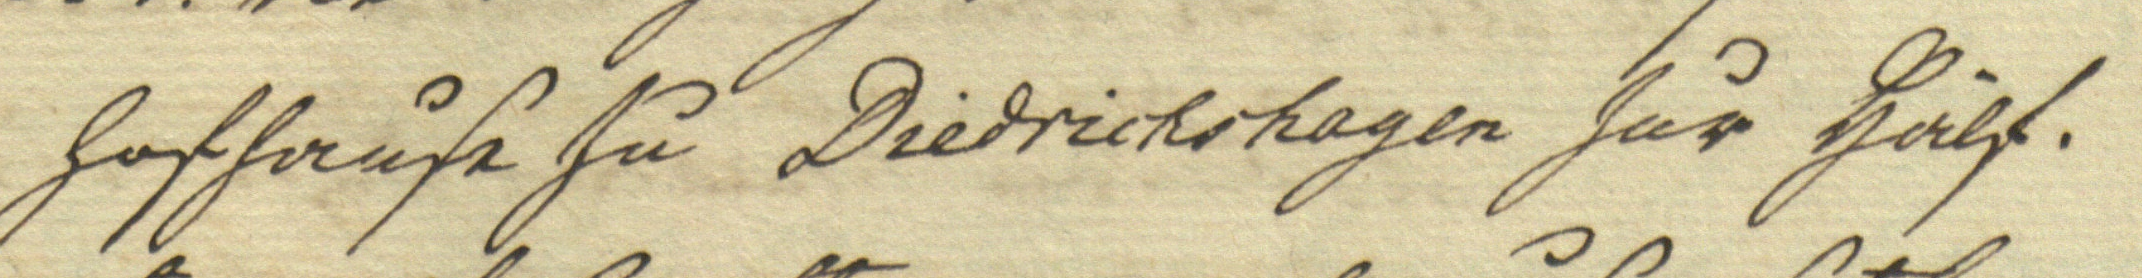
Hofhause zu Diedrichshagen zur Hälf¬
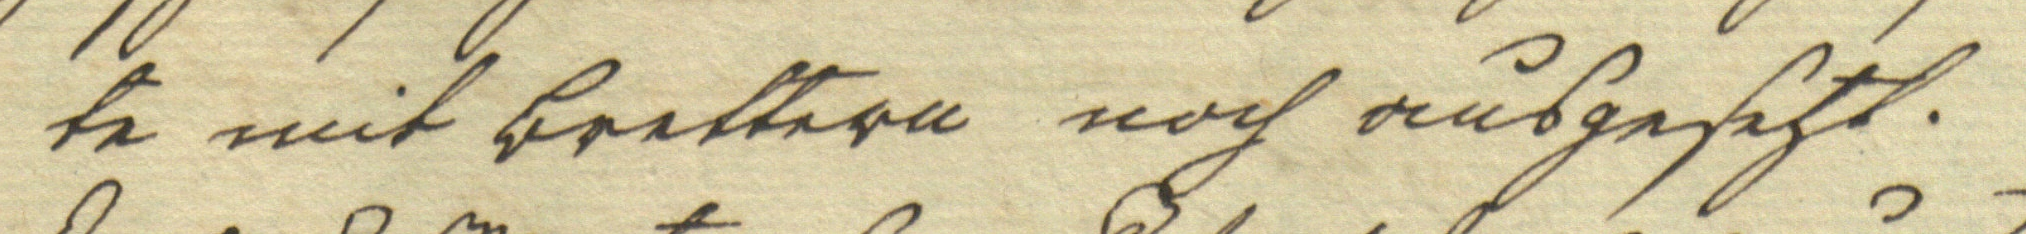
te mit Brettern noch ausgesetzt.
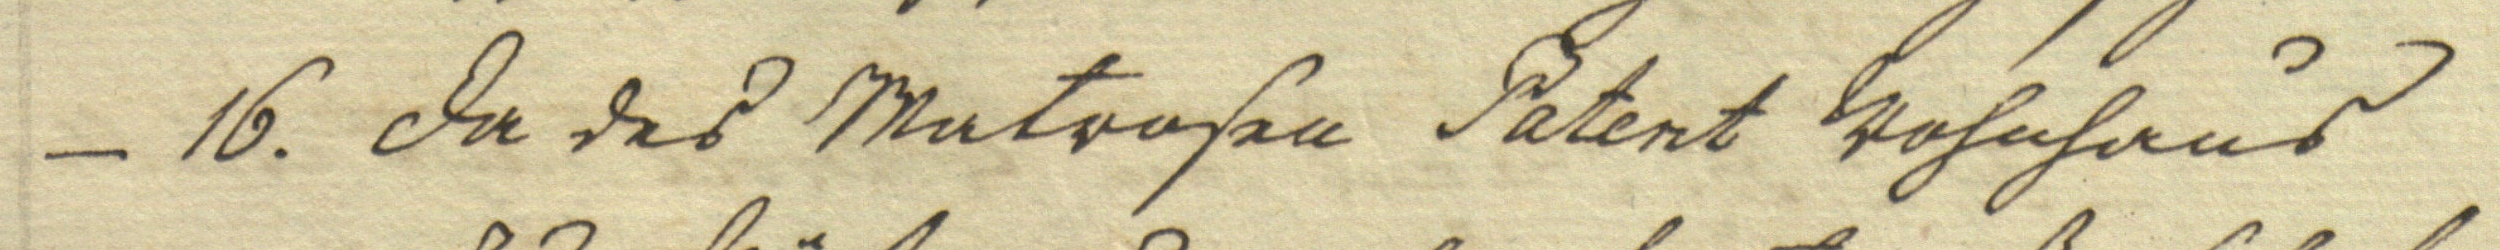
16. Da des Matrosen Patent Wohnhaus
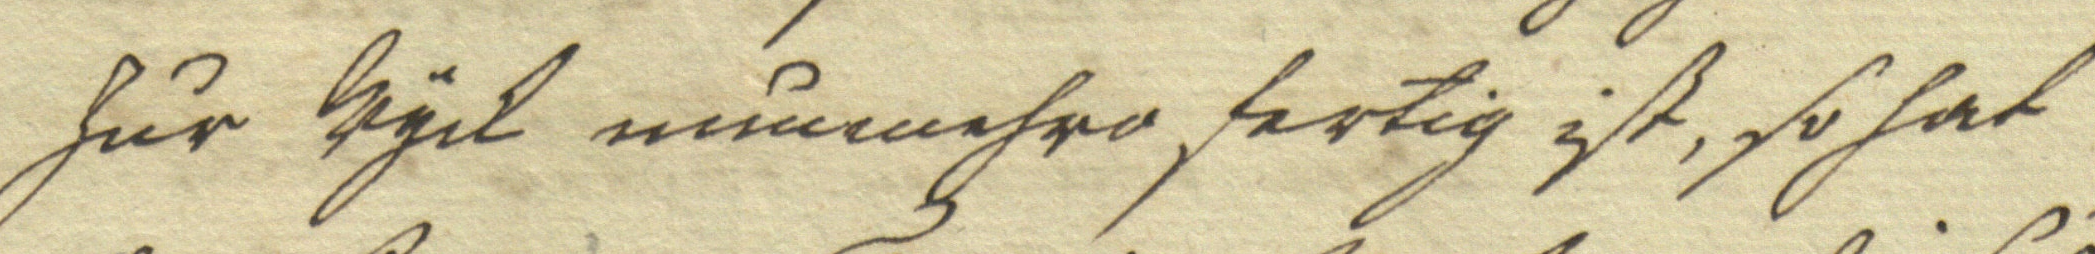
zur Wÿck nunmehro fertig ist, so hat
